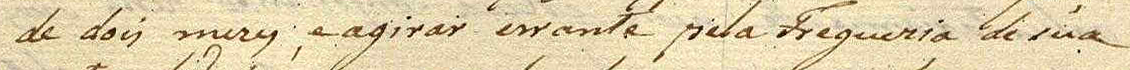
de dois mezes; e a girar errante pela Freguezia de sua
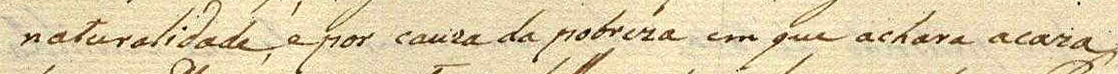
naturalidade, e por cauza da pobreza em que achara a caza
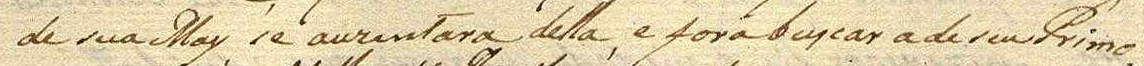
de sua May se auzentara della, e fora buscar a de seu Primo,
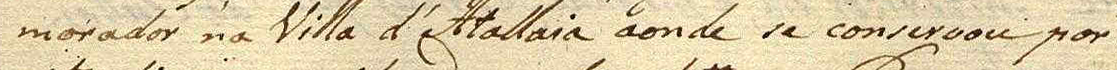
morador na Villa d'Atallaia aonde se conservou por
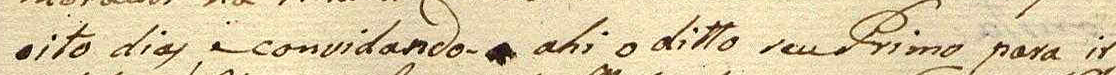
oito dias, e convidando-o ahi o ditto seu Primo para ir
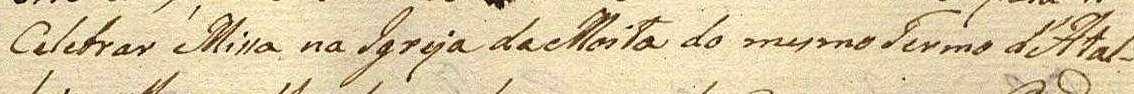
Celebrar Missa na Igreja da Moita do mesmo Termo d'Atal
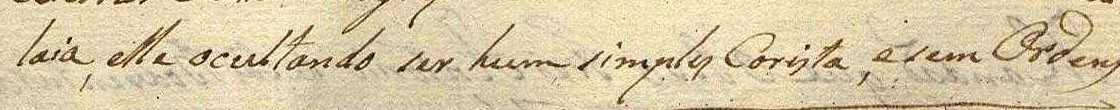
laia, elle ocultando ser hum simples Corista, e sem Ordens
